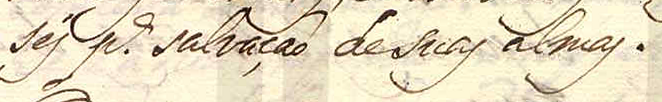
sés p.a salvaçaõ de suas almas.
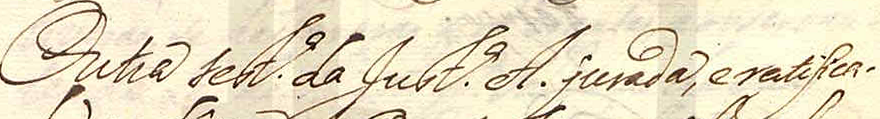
Outra test.a da Just.a A. jurada, e ratifica-
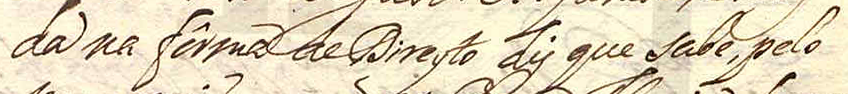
da na fôrma de Direyto dis que sabe, pelo
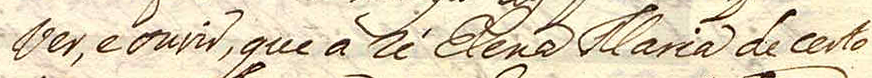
ver, e ouvir, que a Ré Elena Maria de certo
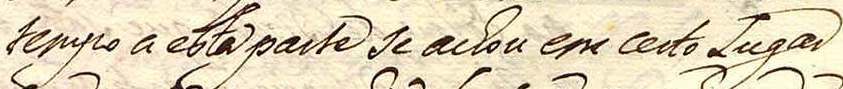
tempo a esta parte se achou em certo Lugar
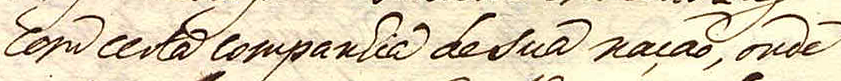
com certa companhia de sua naçaõ, onde
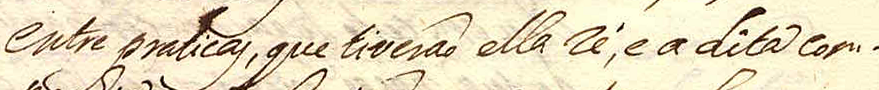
entre praticas, que tiverão ella Ré, e a dita com
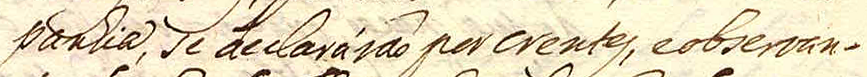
panhia, se declaráraõ por crentes, e observan
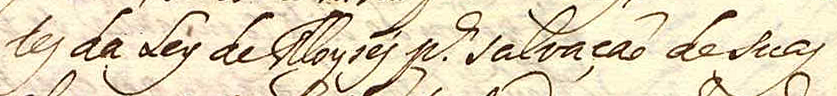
tes da Ley de Moyses p.a salvaçaõ de suas
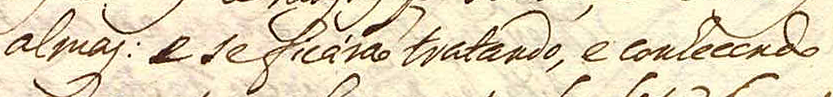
almas: e se ficára tratando, e conhecendo
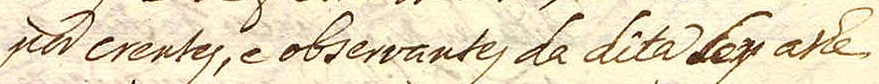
por crentes, e observantes da dita Ley athe
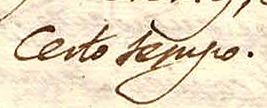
certo tempo.
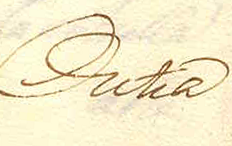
Outra
